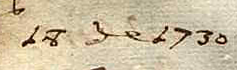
18 de 1730
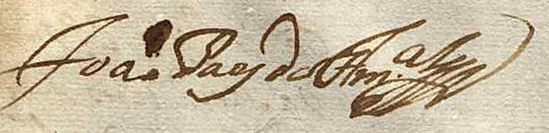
Joaõ Paes de Am.al
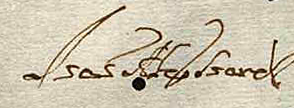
Ioaõ Alrs̄ soares
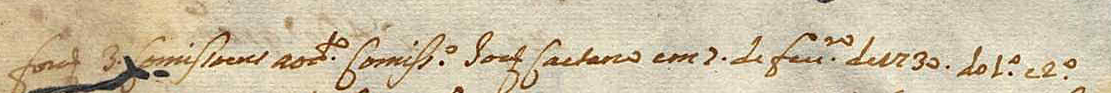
foraõ 3. Comissoens ao d̄o Comiss.o Ioaõ Caetano em 7. de feu.ro de 1730. do 1.o e 2.o
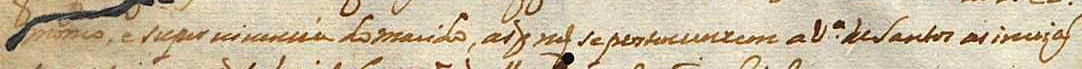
moneo, e superuiuencia do marido, as q̄ naõ se pertencerem a V.a de Santos as inuia
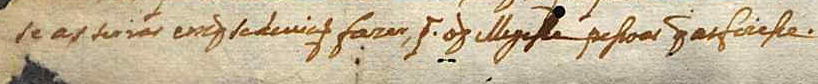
se as terras em q̄ se deuiaõ fazer, p.a o q̄ ellegesse pessoas q̄ as fizesse.
